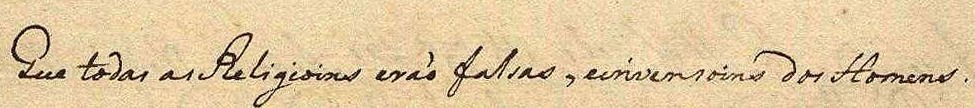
Que todas as Religioins eraõ falsas, e invensoins dos Homens.
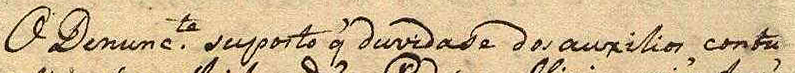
O Denunc.te suposto q̄ duvidase dos auxilios, contu
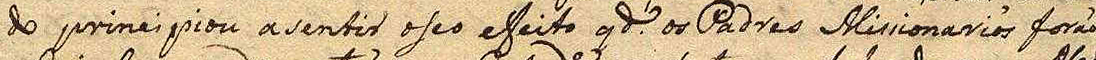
do principiou a sentir o seo effeito q.do os Padres Missionarios foraõ
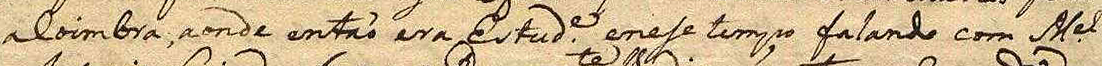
a Coimbra, aonde entaõ era Estud.e e nese tempo falando com M.el
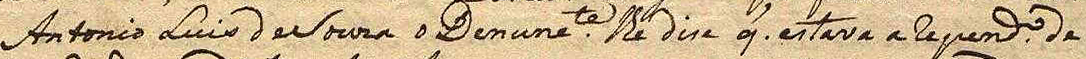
Antonio Luis de Souza o Denunc.te lhe dise q̄ estava aRepend.o de
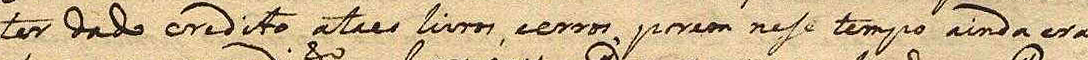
ter dado credito a taes livros, e erros, porem nese tempo ainda era
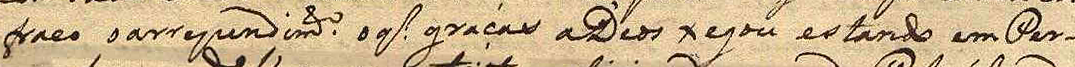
fraco o arrependim.to o q̄ graças a Deos xegou estando em Per
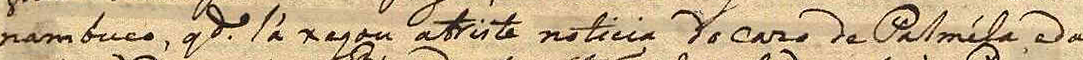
nambuco, qd.o lá xegou a triste noticia do cazo de Palméla, e da
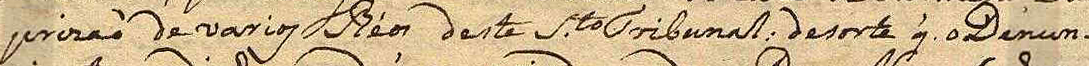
prizaõ de varios Réos deste S.to Tribunal: de sorte q̄ o Denun
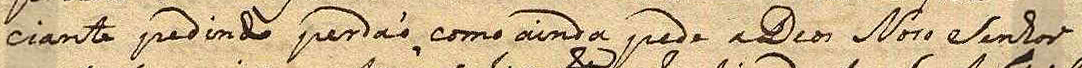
ciante pedindo perdaõ, como ainda pede a Deos Noso Senhor
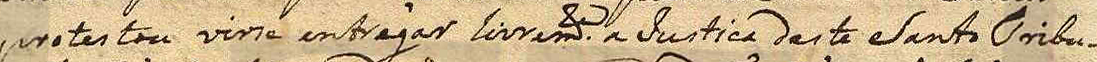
protestou virse entregar livrem.te a Iustiça deste Santo Tribu
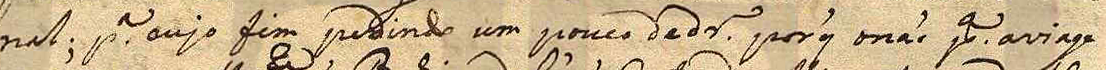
nal; p.a cujo fim pedindo um pouco de d.to porq̄ o naõ p.a a viage
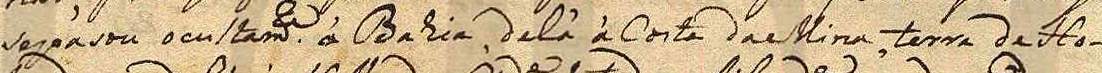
se pasou ocultam.te à Bahia de lá à Costa da Mina, terra de Ho
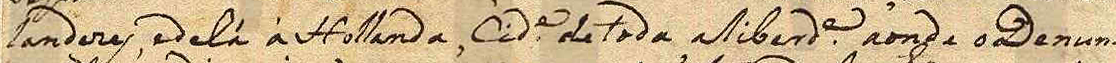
landezes, e de lá à Hollanda Cid.e de toda a liberd.e, aonde o Denun
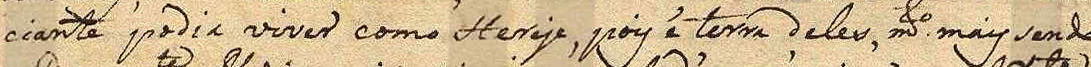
ciante podia viver como Hereje, pois é terra deles, m.to mais sendo
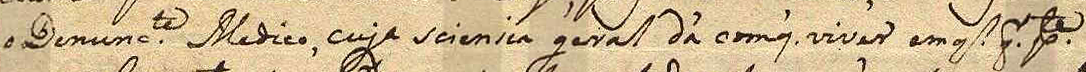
o Denunc.te Medico, cuja sciensia geral dá com q̄ viver em ql.q.r p.te
